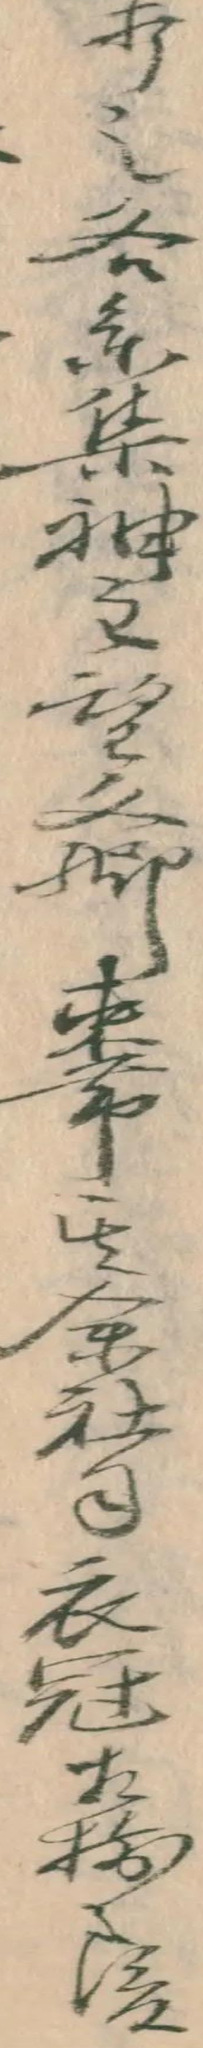打之各参集神主望久卿束帯其余社司衣冠相揃之後
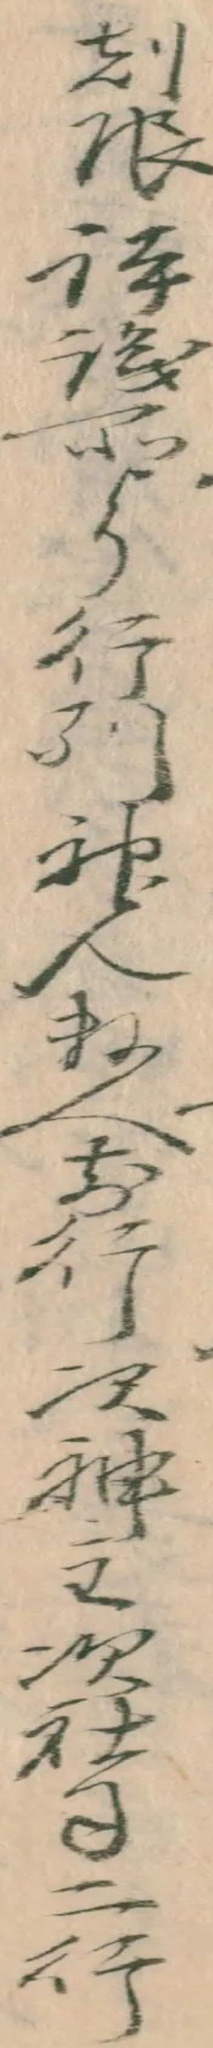刻限評議所より行列神人数人前行次神主次社司二行
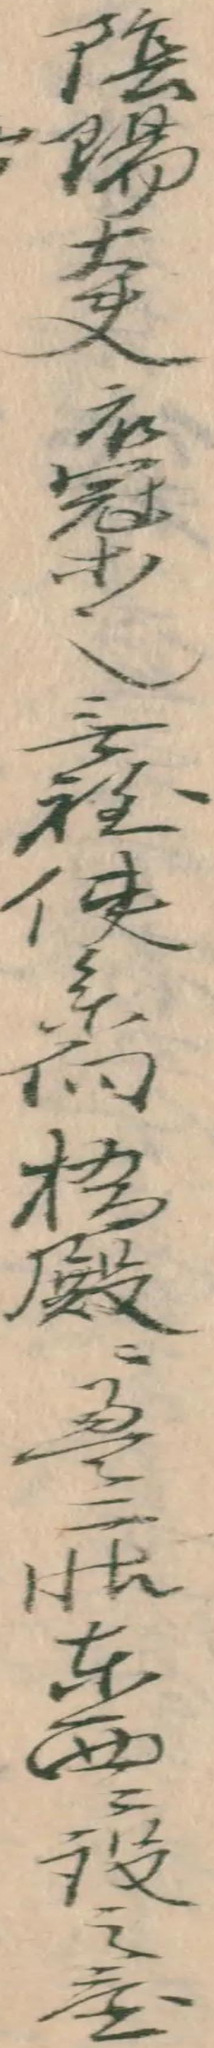陰陽大夫衣冠等也無程使参向橋殿ニ畳二帖東西ニ設之置
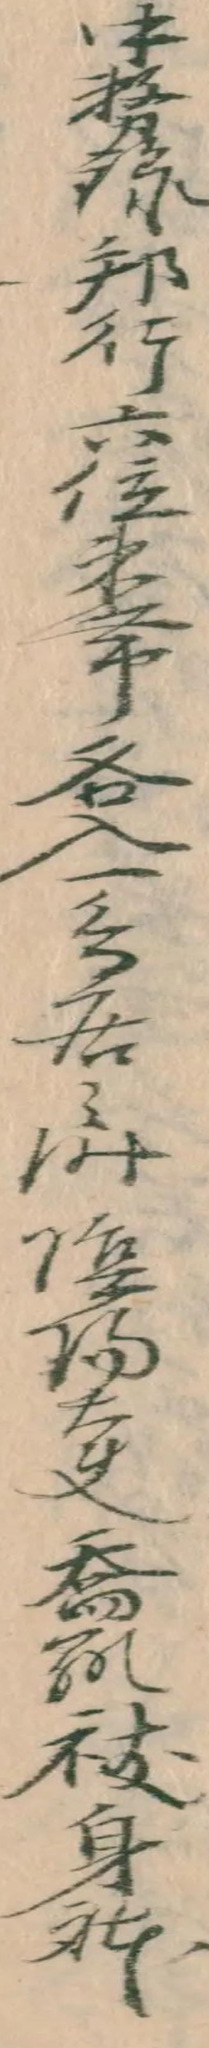中務様邦行六位束帯各入一鳥居之時陰陽大夫喬顕祓身躰
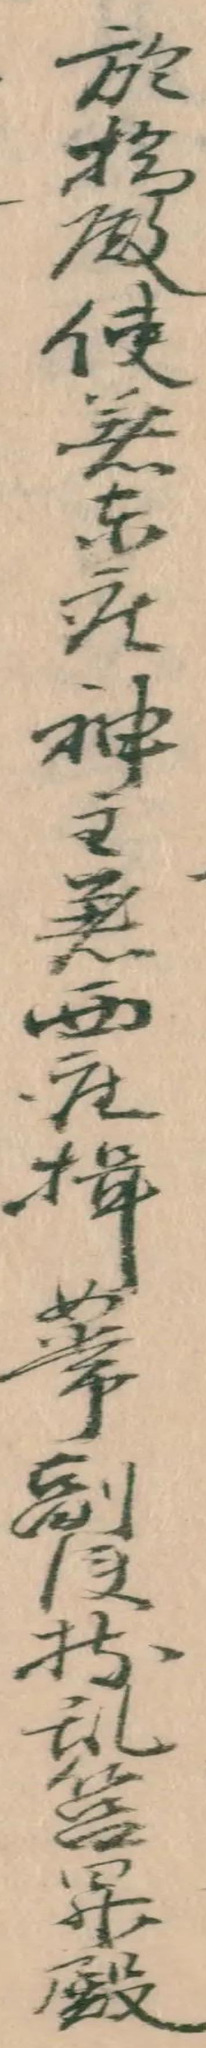於橋殿使着東座神主着西座揖如常副使持乱筥昇殿
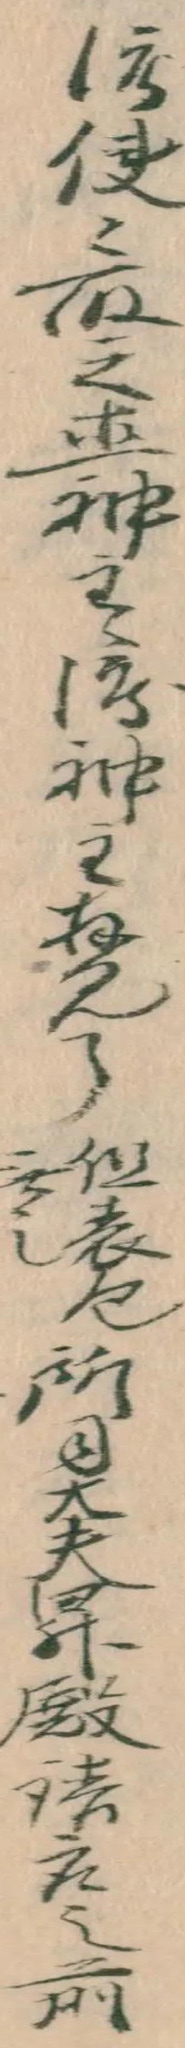渡使々取之直神主へ渡神主拝見了但表包無之所司大夫昇殿請取之前
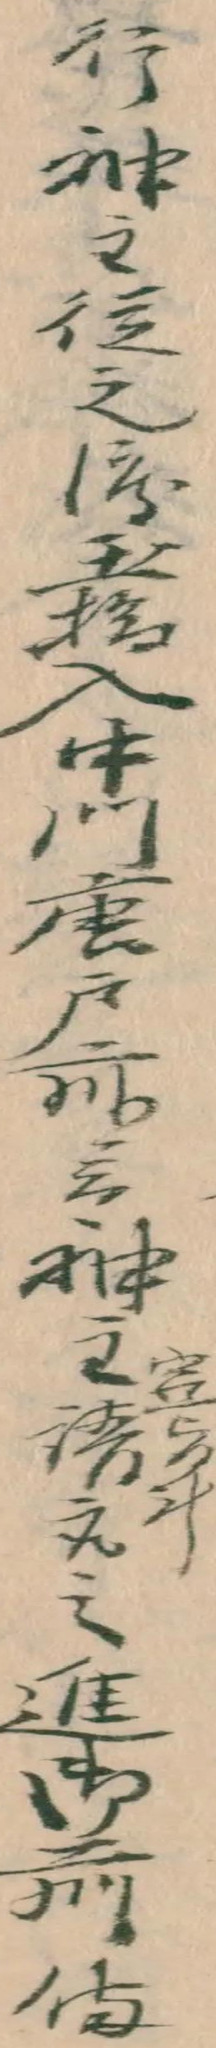行神主従之渡玉橋入中門唐戸前ニ而神主宣旨斗請取之進御前備
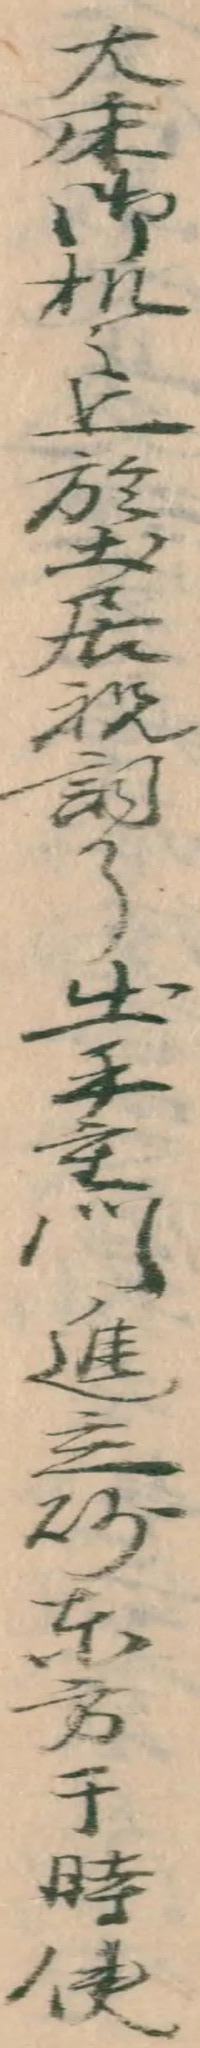大床御机之上於土居祝詞了出平重門進立砂東方于時使
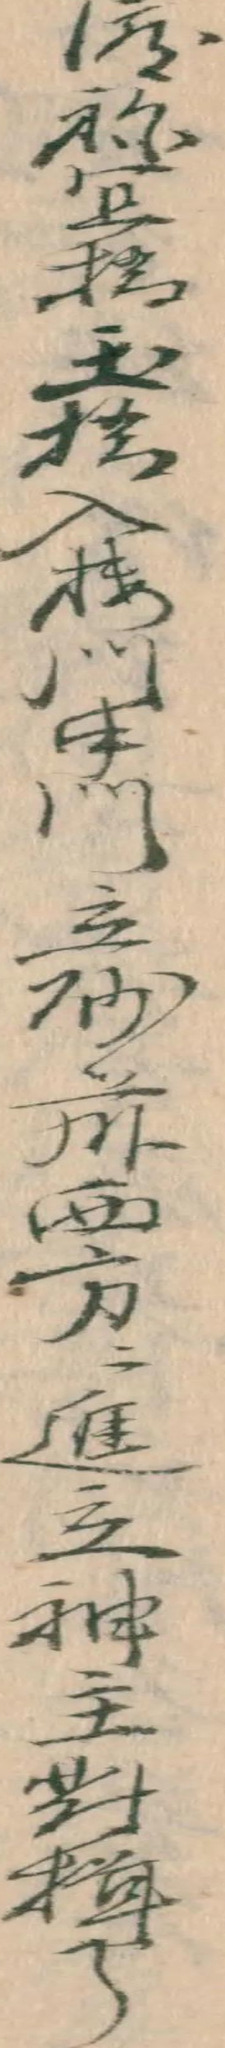渡称宜橋玉橋入楼門中門立砂前西方ニ進立神主對楫了
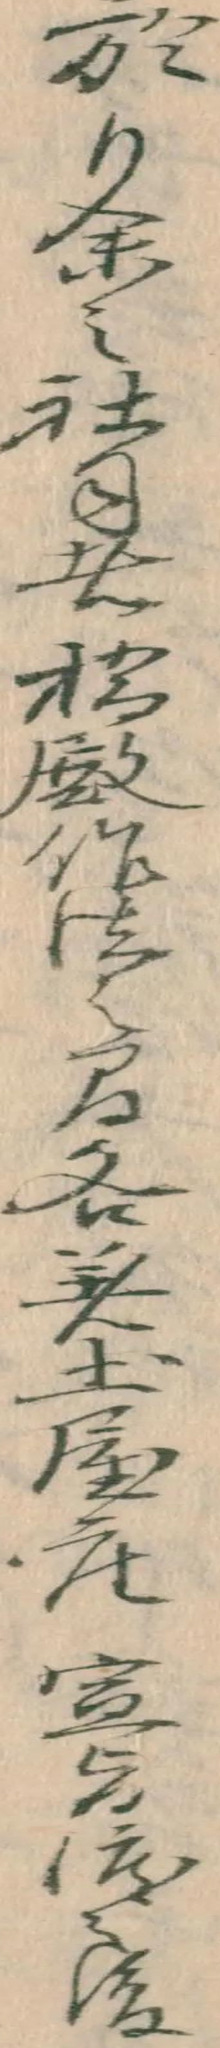於自余之社司者橋殿作法之間各着土屋座宣旨渡之後
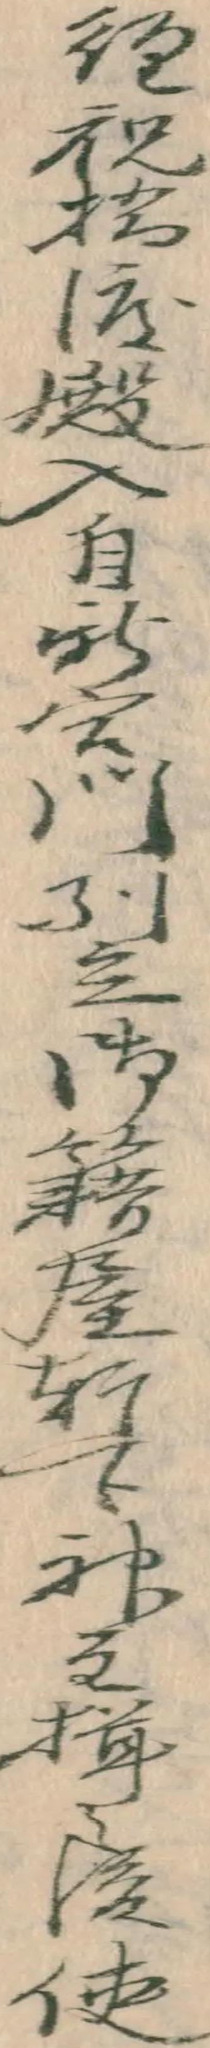経祝橋渡殿入自新宮門列立御籍屋軒下神主揖之後使
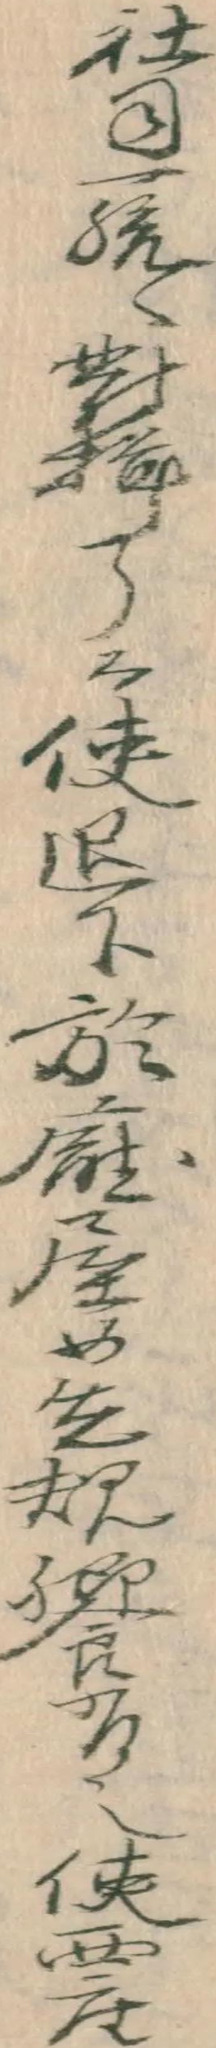社司一統へ對揖了而使退下於廰屋如先規饗有之使西座
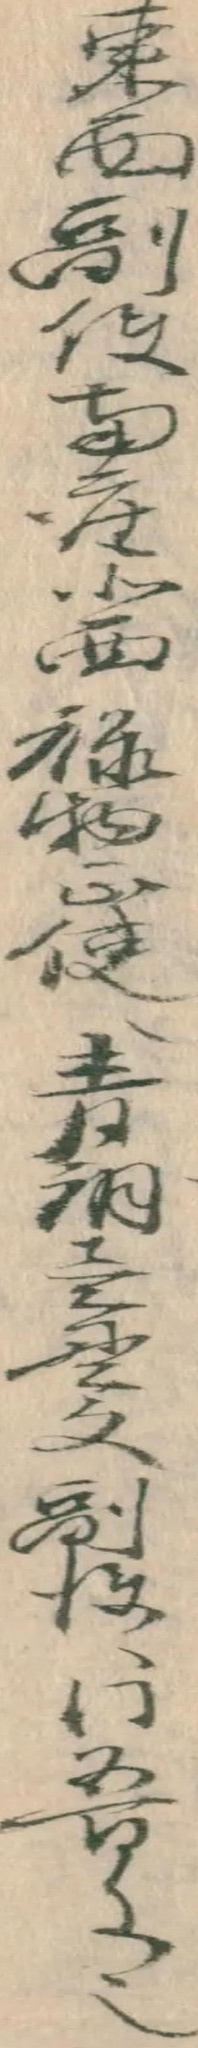東西副使両座北西禄物正使へ青銅壱貫文副使へ同五百文也
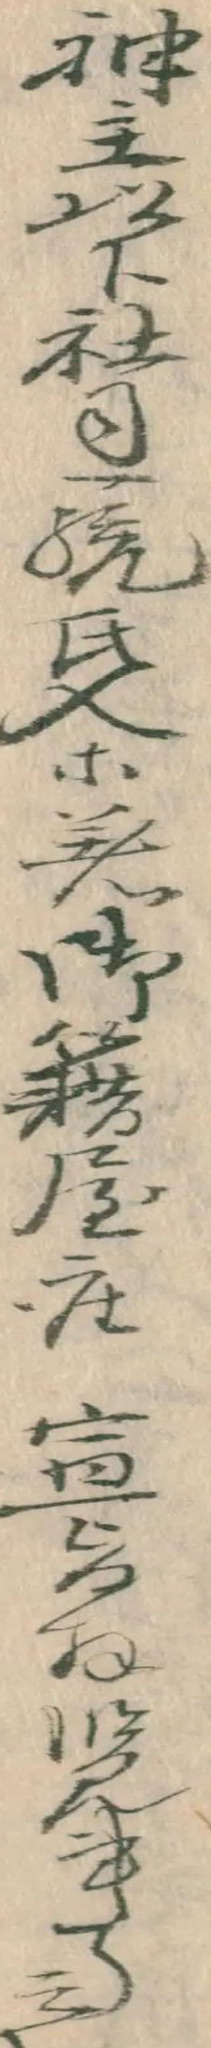神主以下社司一統氏人等着御籍屋座宣旨拝覧事了云々
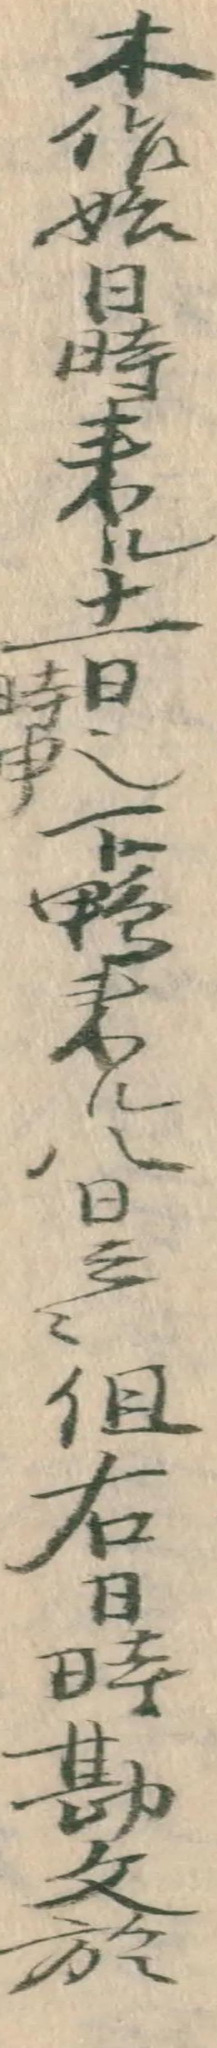木作始日時来ル十一日也時申下鴨来ル八日云〻但右日時勘文於
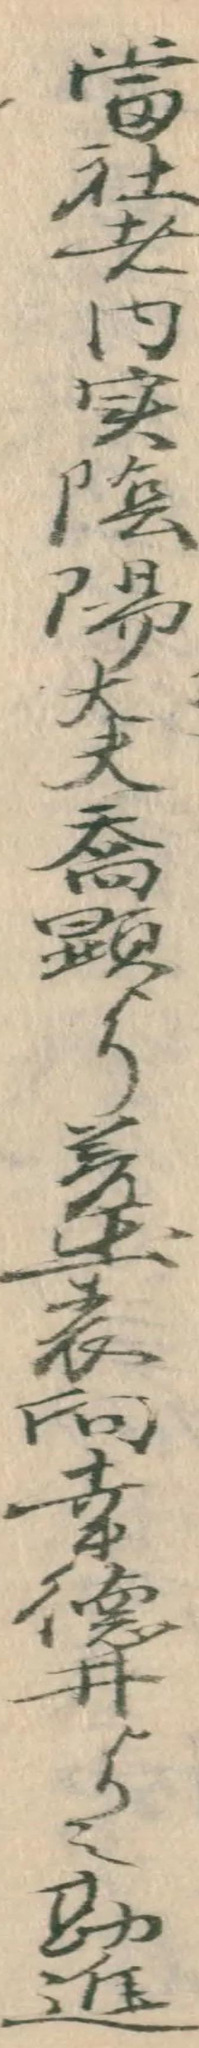當社者内実陰陽大夫喬顕より差出表向幸徳井より之勘進
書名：賀茂社記録. 第66冊
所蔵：国立国会図書館 National Diet Library, JAPAN
